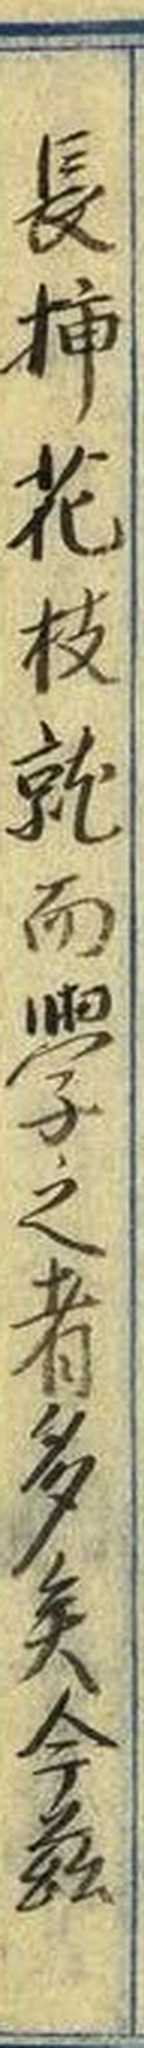長挿花枝就而學之者多矣今茲
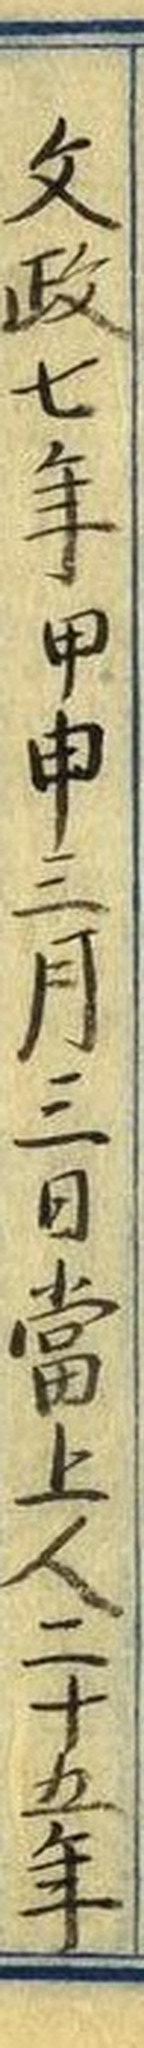文政七年甲申三月三日當上人二十五年
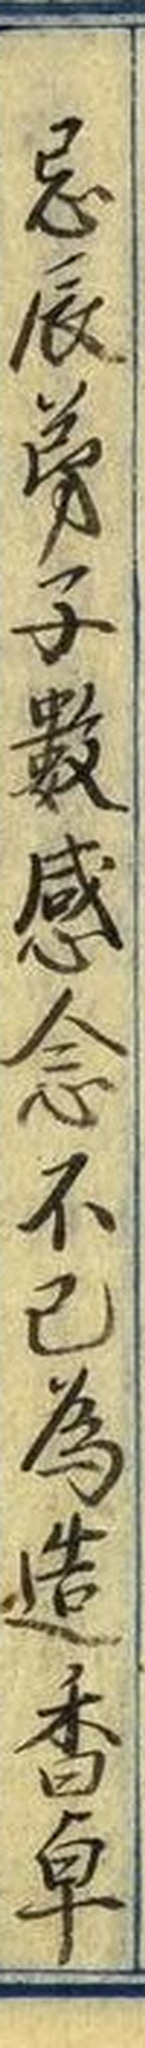忌辰弟子數感念不已為造香卓
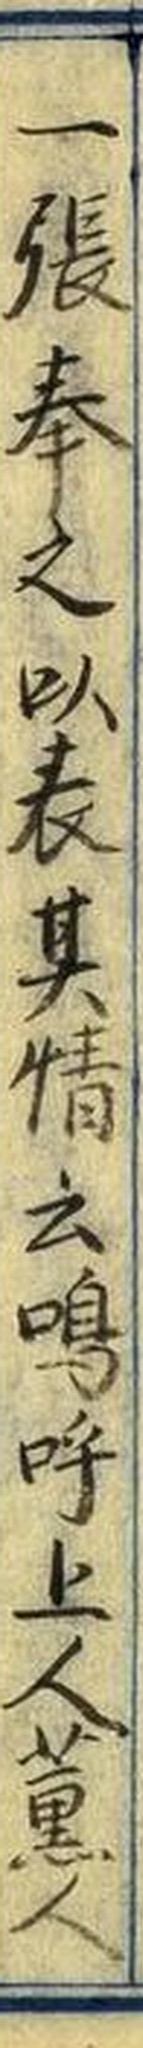一張奉之以表其情云嗚呼上人薫人
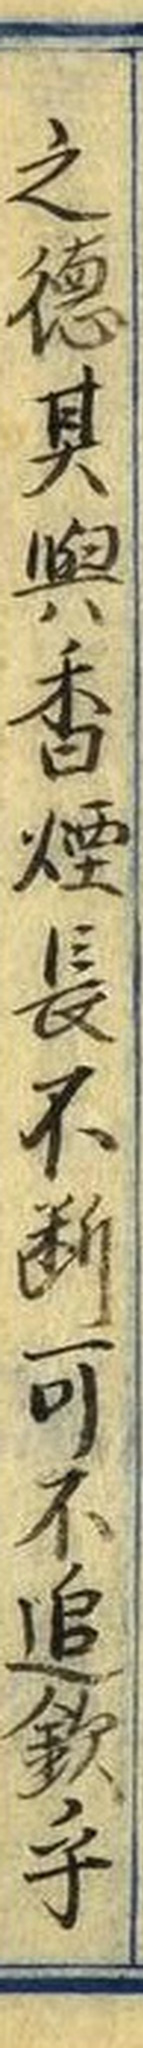之徳其與香煙長不断可不追欽乎
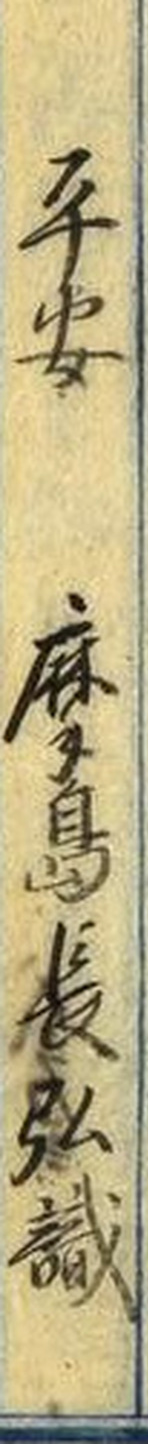平安摩島長弘識

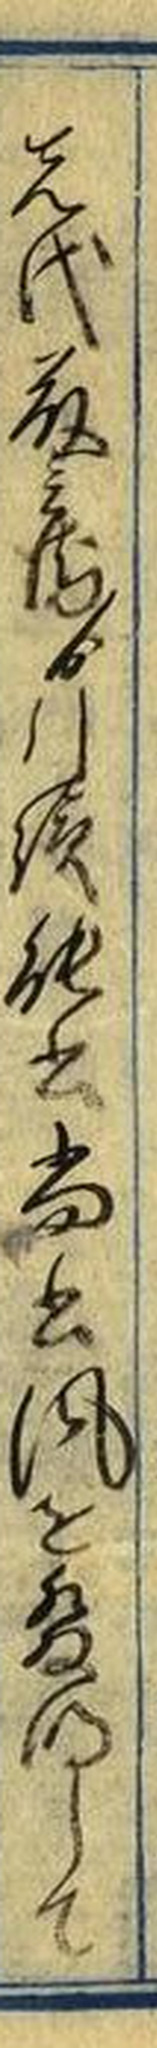先代藤兵衛ゟ引続能書尚書風を発明して
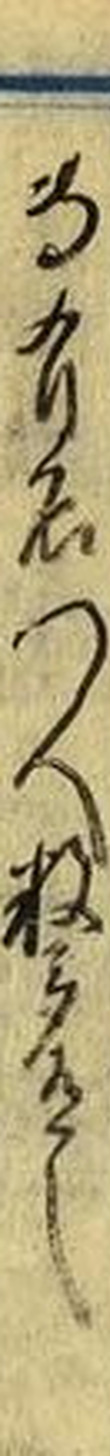為有名門人数多有之
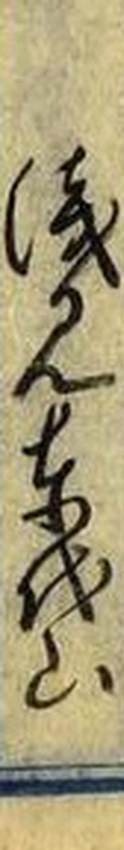浅見東儀山
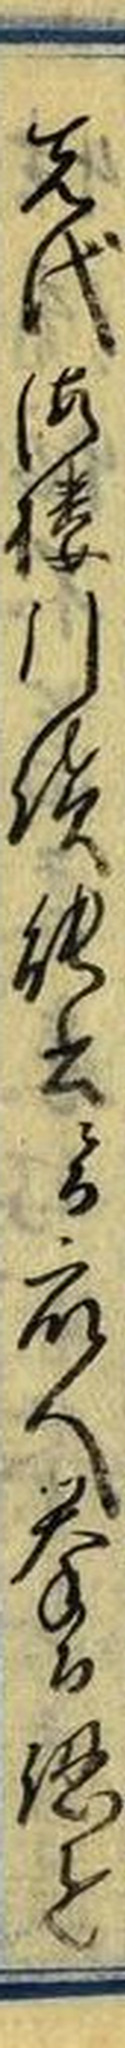先代海楼引続能書に而衆人挙而認を
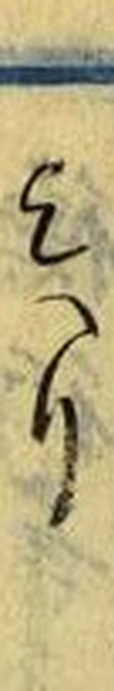乞へり
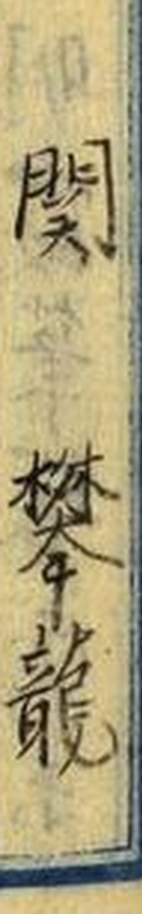関攀龍
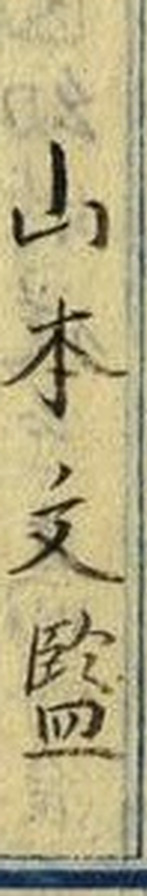山本文監
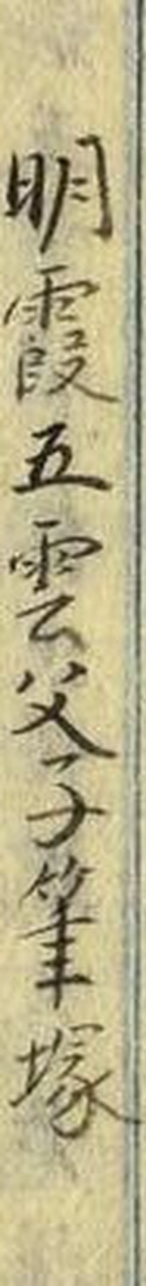明霞五雲父子筆塚
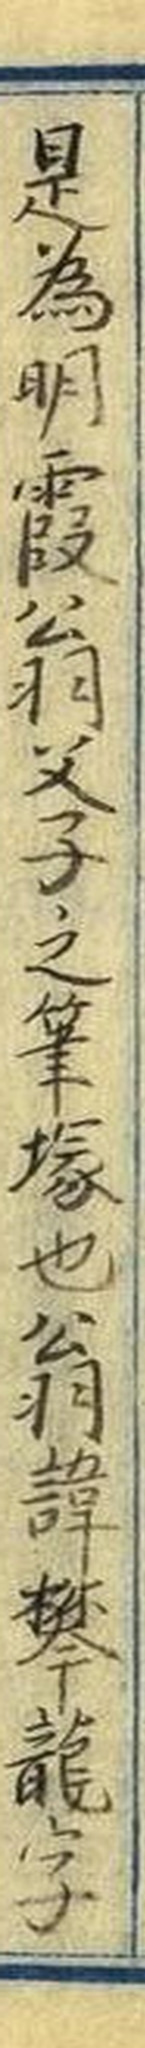是為明霞翁父子之筆塚也翁諱攀龍字
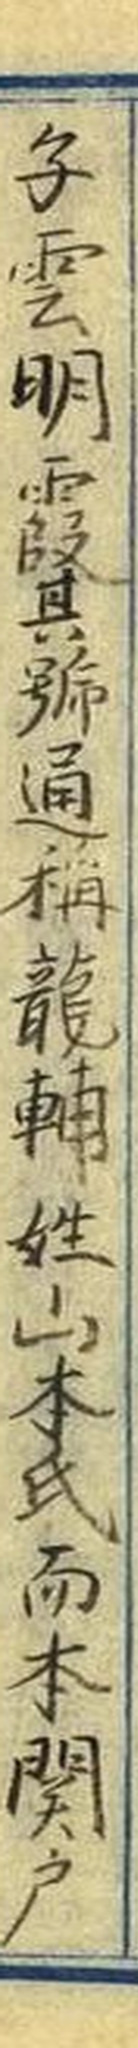子雲明霞其號通稱龍輔姓山本氏而本関戸
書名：温古集 四巻
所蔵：福井県文書館 Fukui Prefectural Archives
